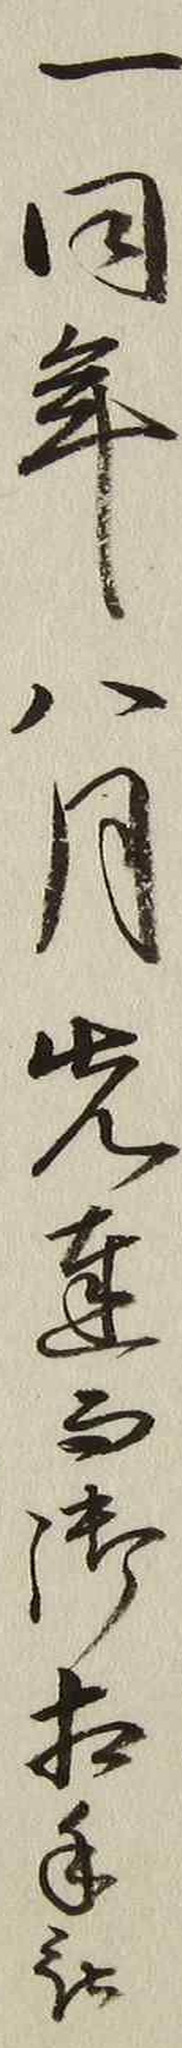一同年八月先達而御相手被
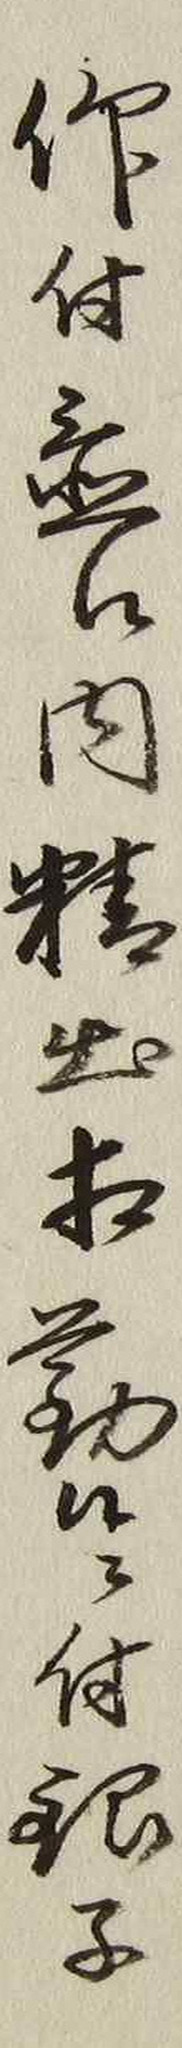仰付置候内精出相勤候ニ付銀子
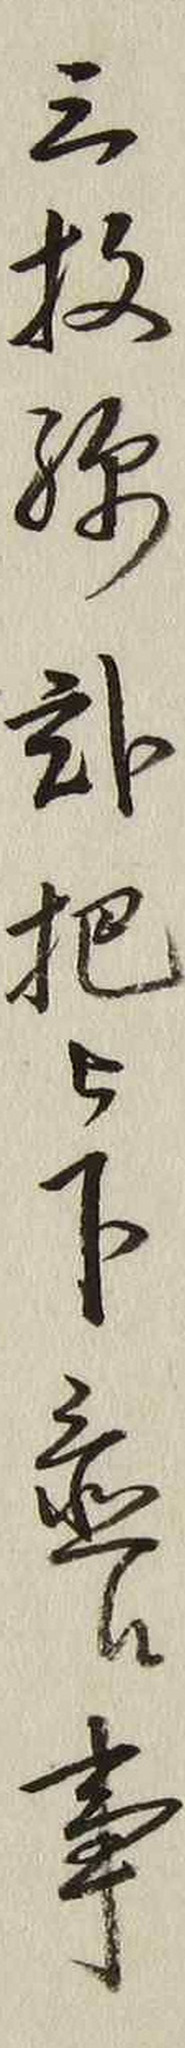三枚綿弐把被下置候事
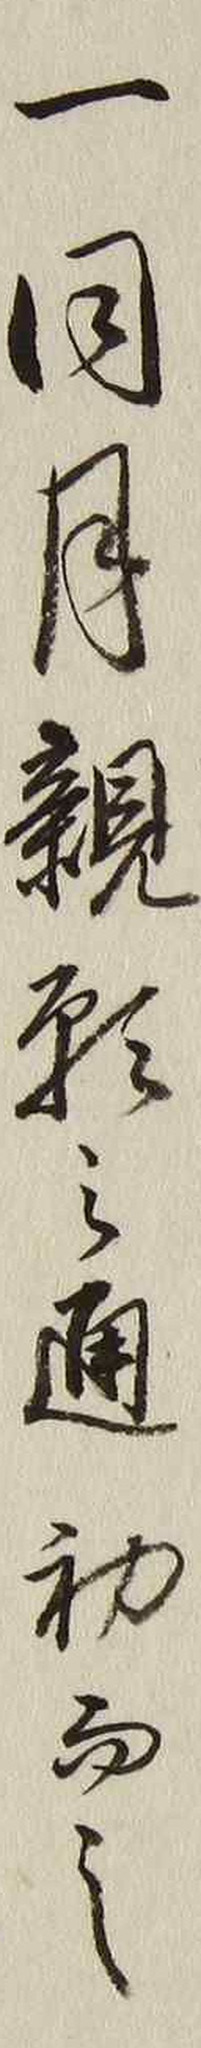一同月親願之通初而之
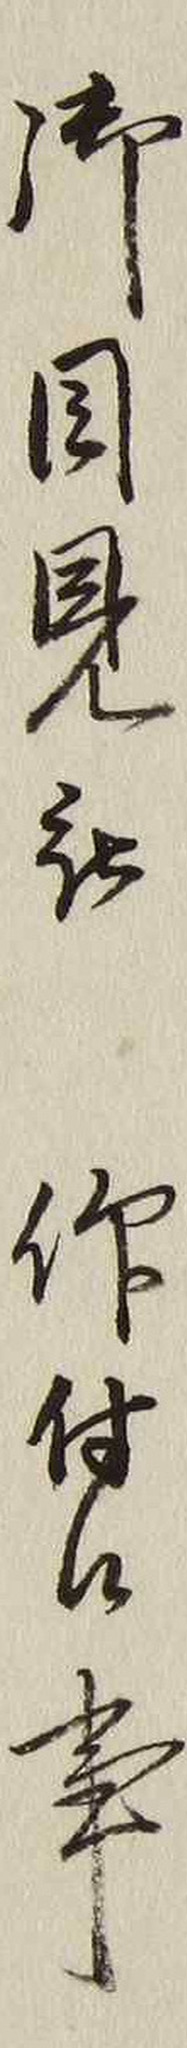御目見被仰付候事
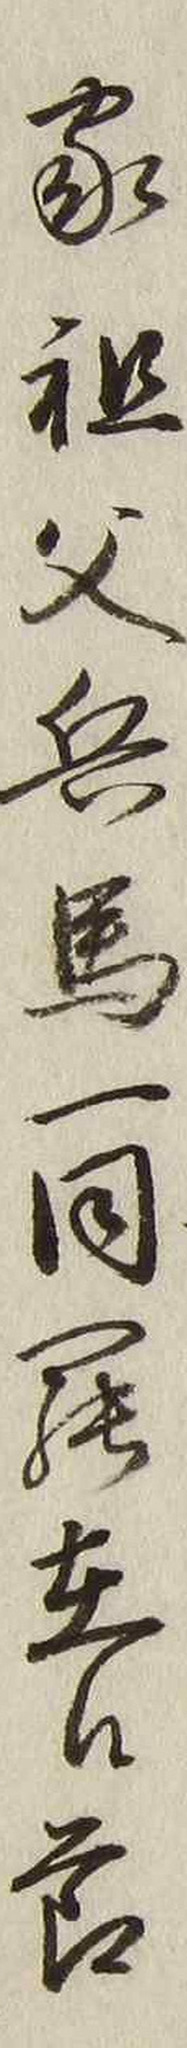家祖父兵馬一同罷在候節

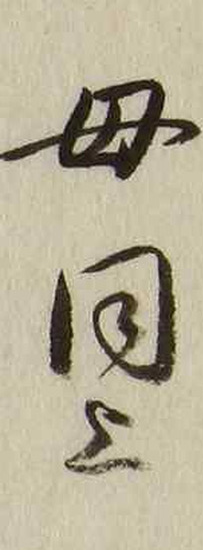母同上
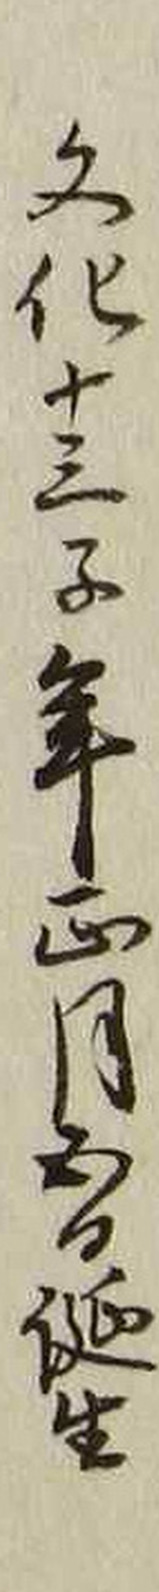六文化十三子年正月五日誕生
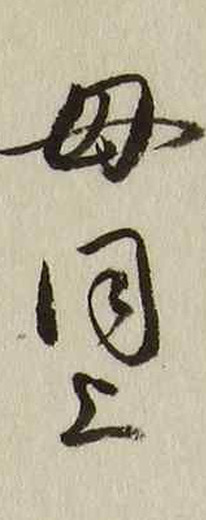母同上
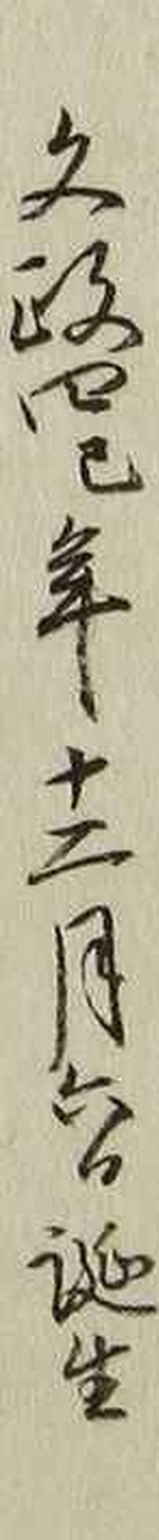八文政四巳年十二月六日誕生
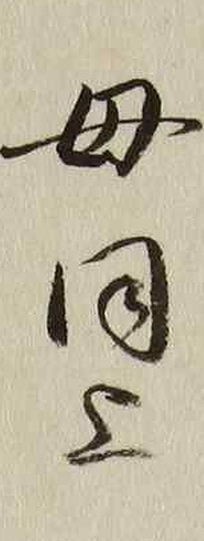母同上
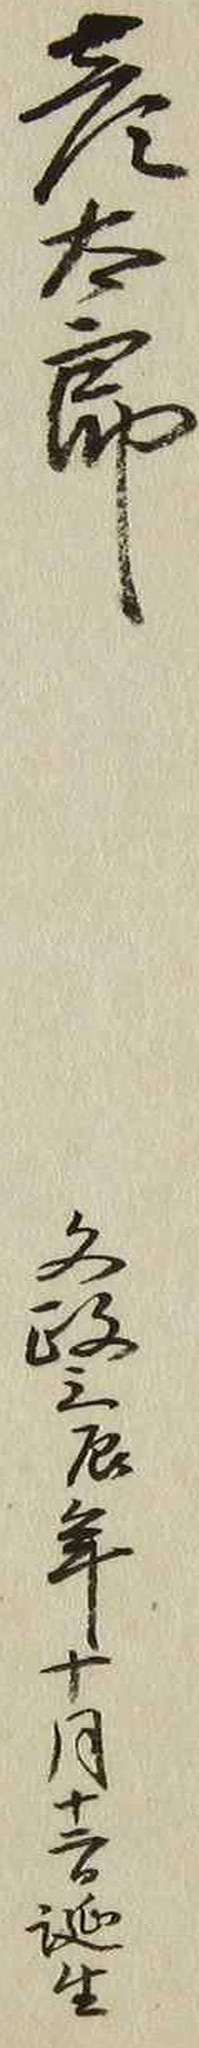彦太郎文政三辰年十月十二日誕生
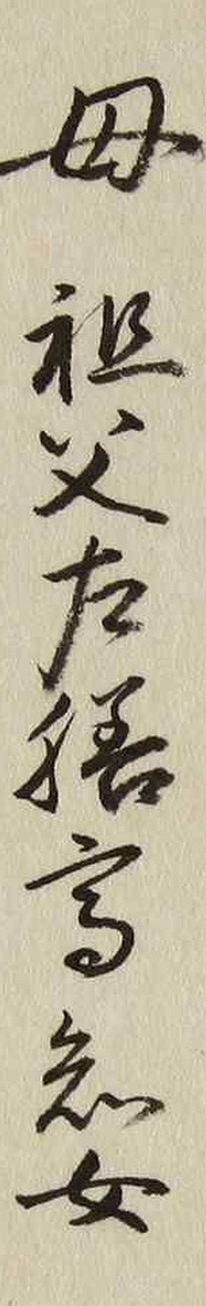母祖父左膳高知女
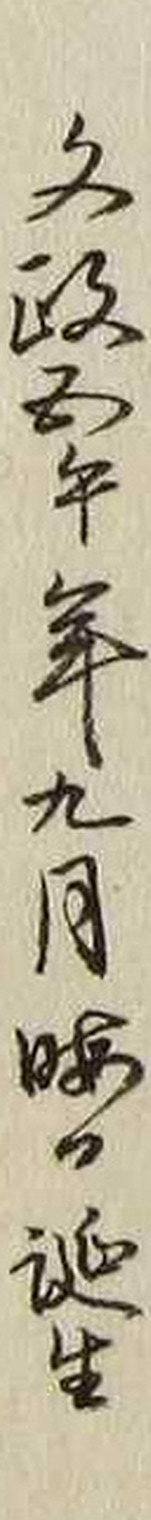女文政五午年九月晦日誕生
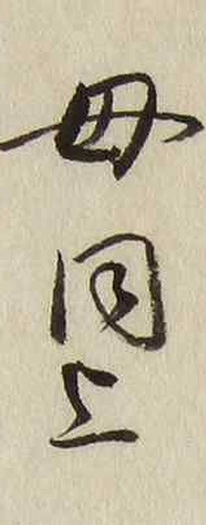母同上
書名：諸士系譜　巻之136　た之部12
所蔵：会津若松市立会津図書館
